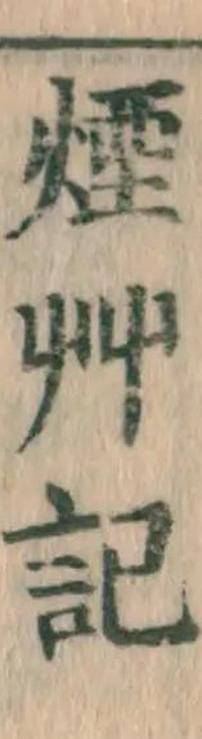煙草記
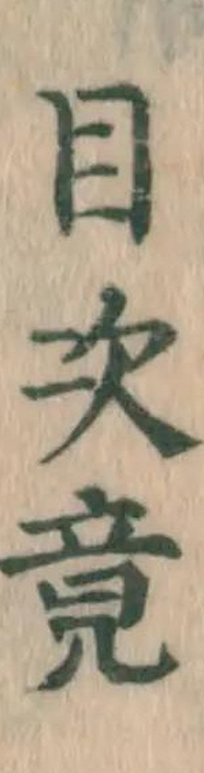目次竟

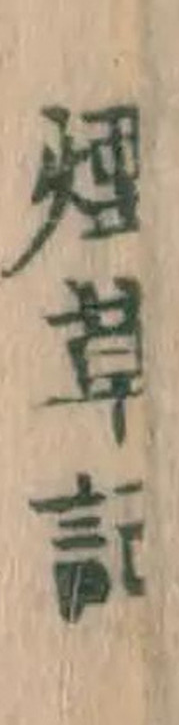煙草記
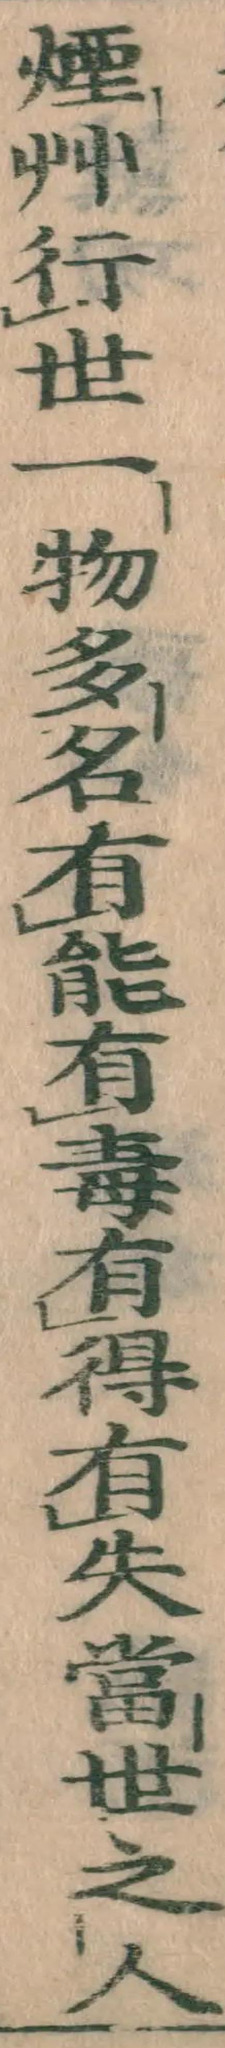煙-草行世一-物多-名有能有毒有得有失当-世之-人
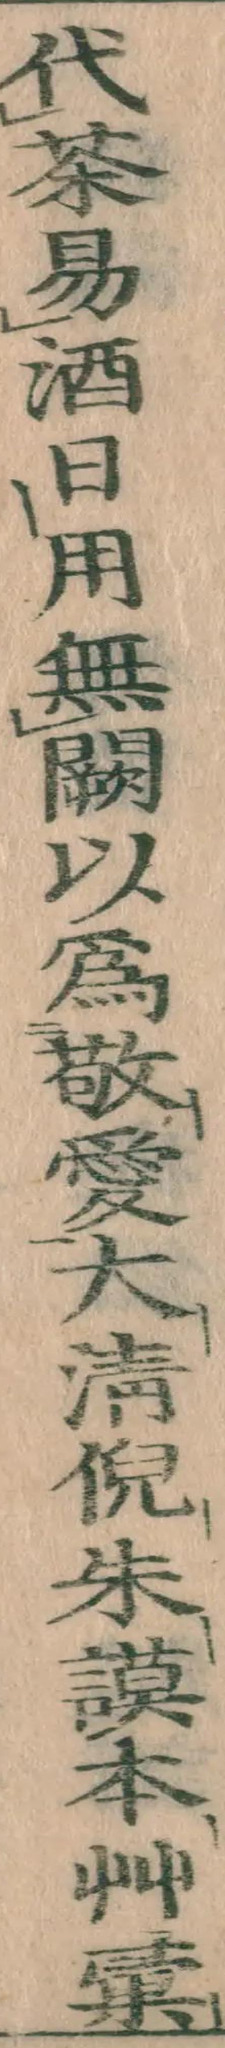代茶易酒日-用無闕以為敬-愛大-清倪-朱-謨本-草彙-
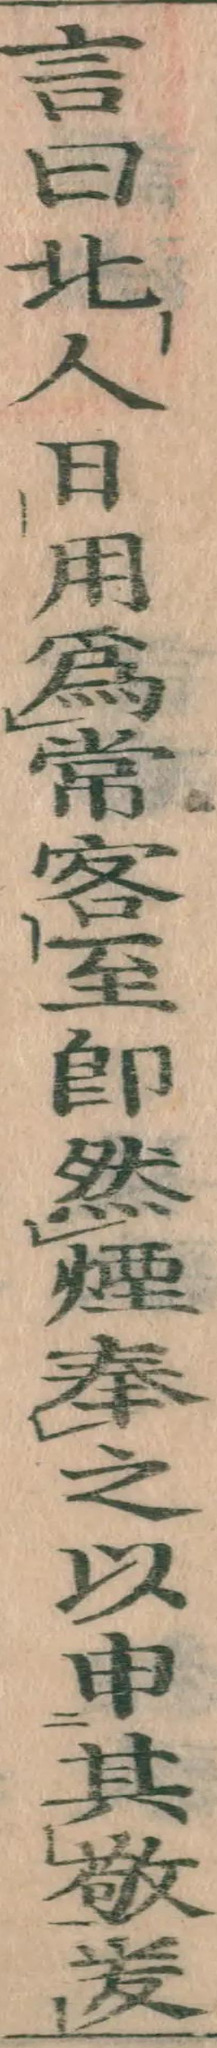言曰北-人日-用為常客-至即然煙奉之以申其-敬愛-
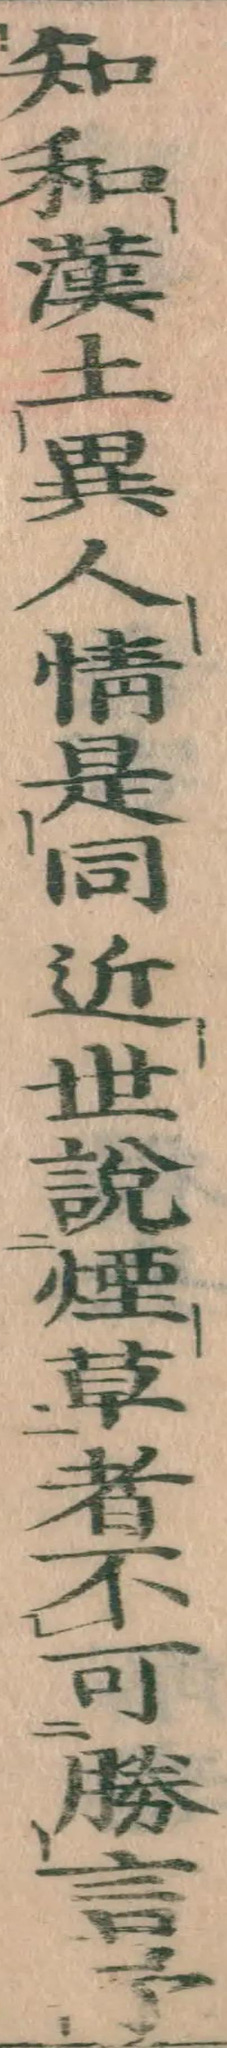-知和-漢土-異人-情是-同近-世説煙-草者不可勝-言予-
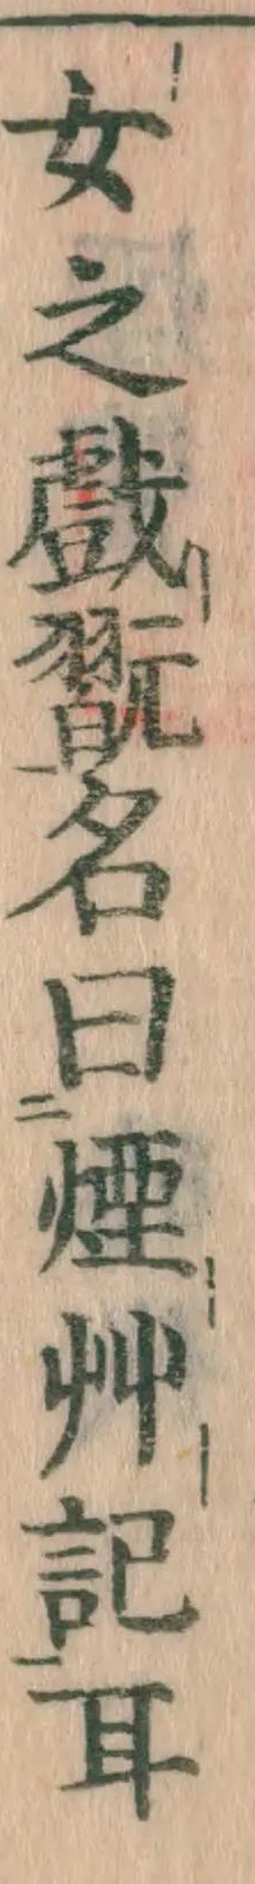-女之戯-翫名曰煙-草-記耳
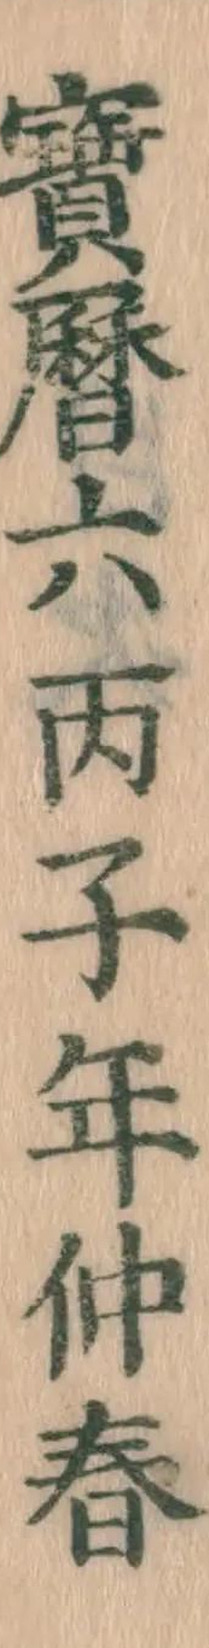宝暦六丙子年仲春
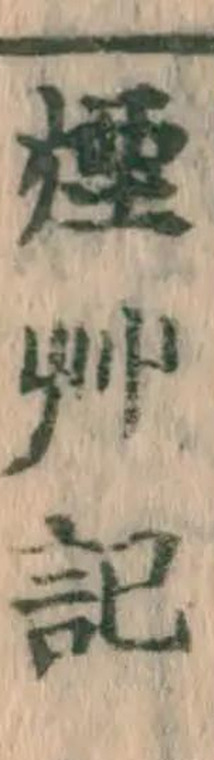煙草記
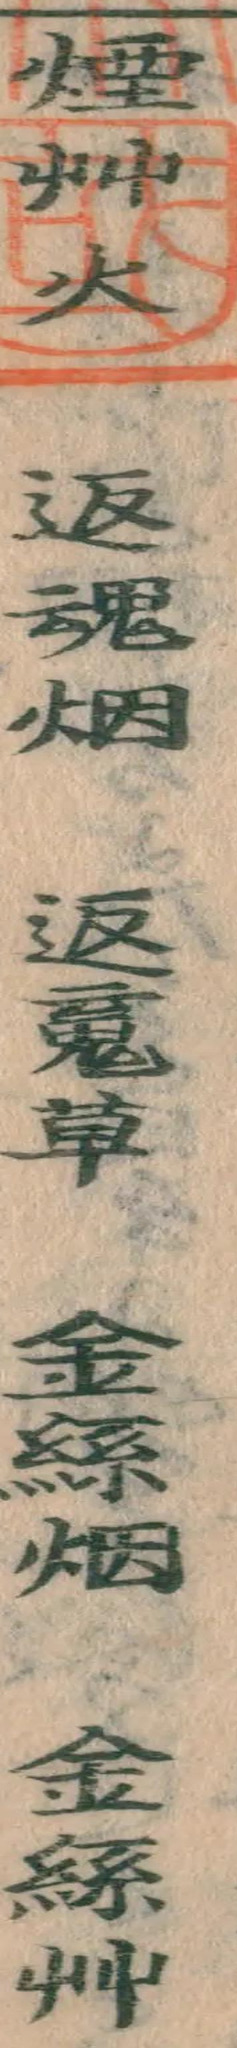煙草火返魂烟返䰟草金糸烟金糸草
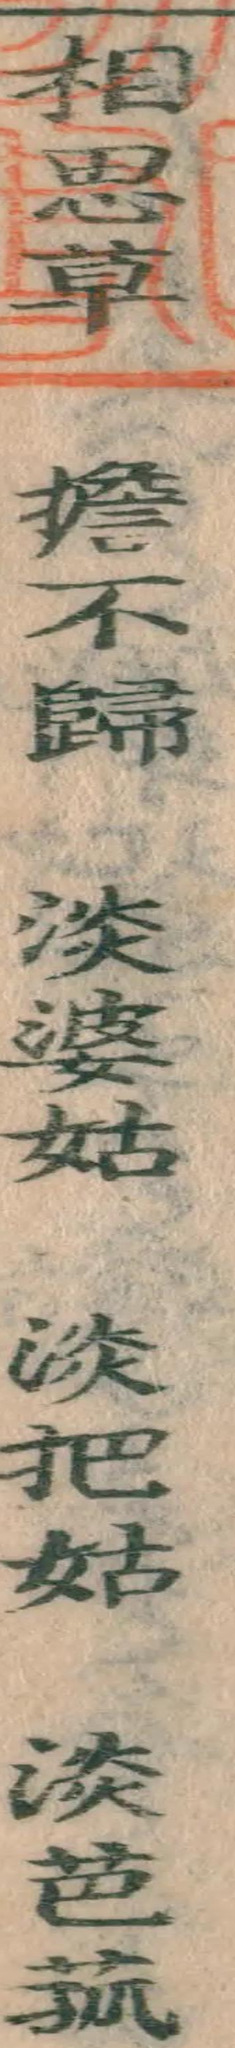相思草担不帰淡婆姑淡把姑淡芭菰
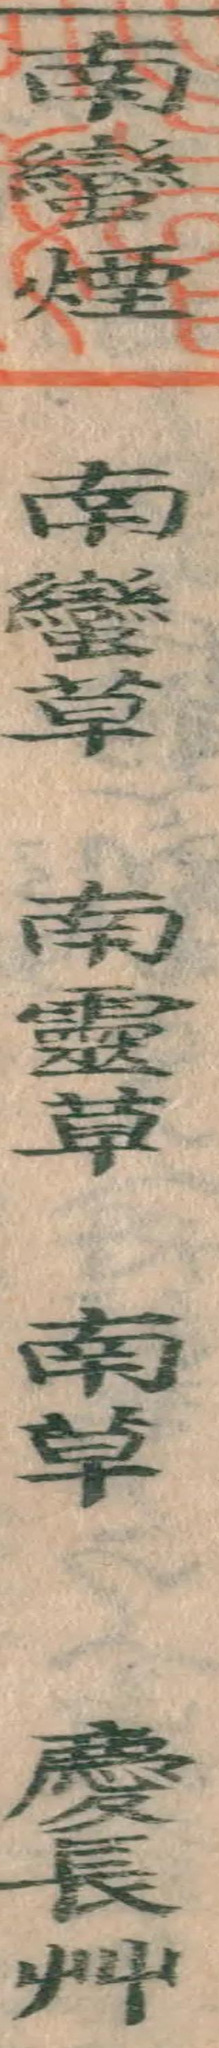南蛮煙南蛮草南霊草南草慶長草
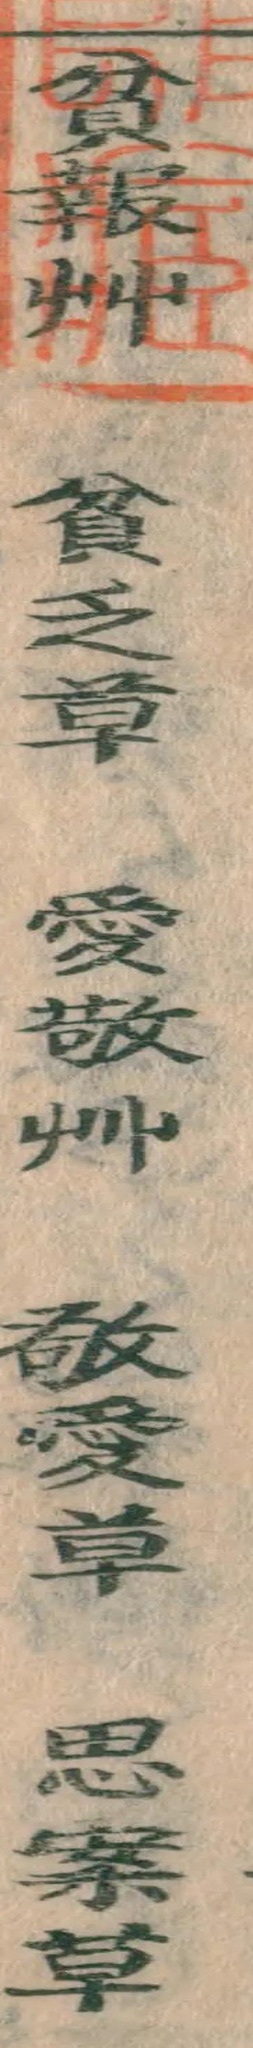貧報草貧乏草愛敬草敬愛草思案草
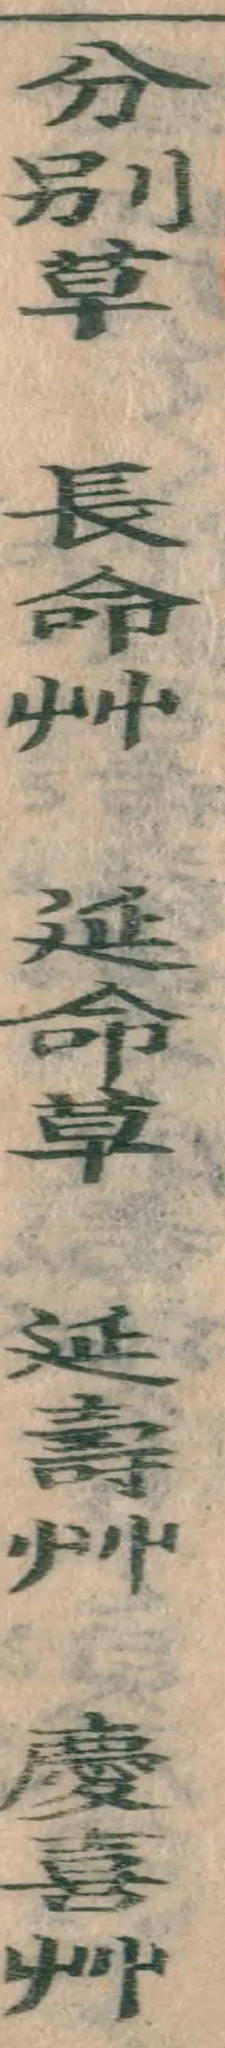分別草長命草延命草延寿草慶喜草
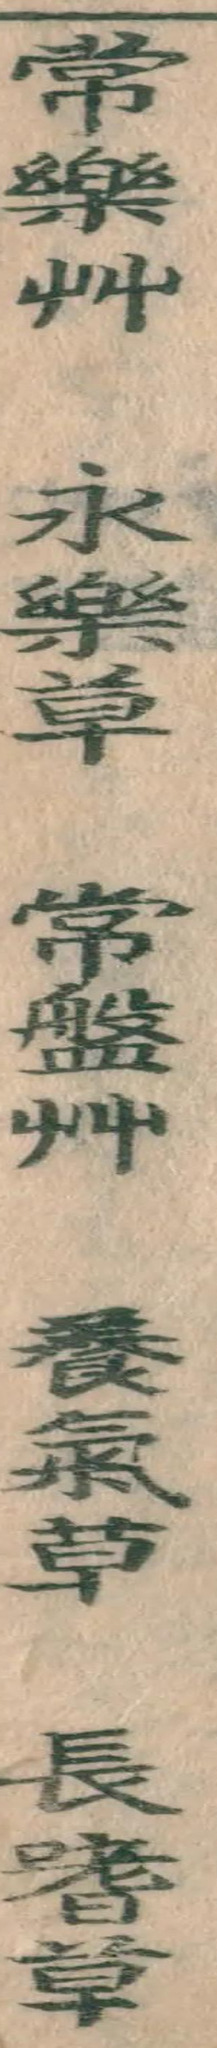常楽草永楽草常盤草養気草長嗜草
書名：煙草記
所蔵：国立国会図書館 National Diet Library, JAPAN
